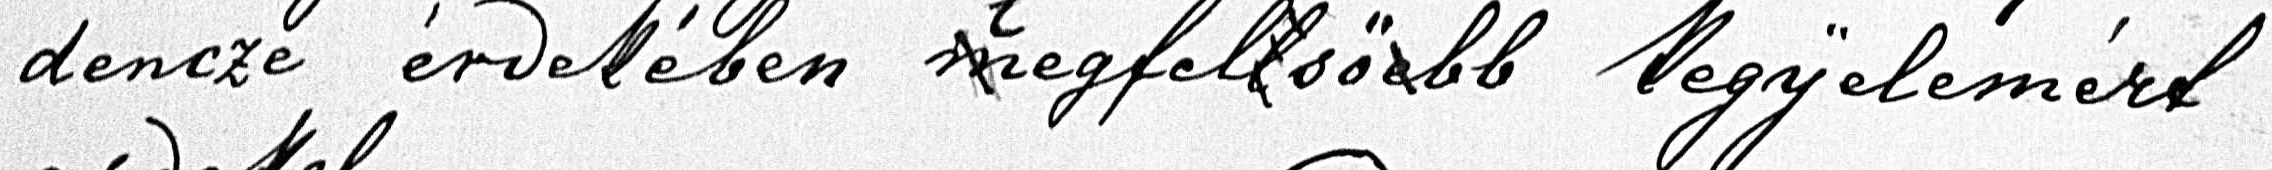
dencze érdekében legfelsőbb kegÿelemért
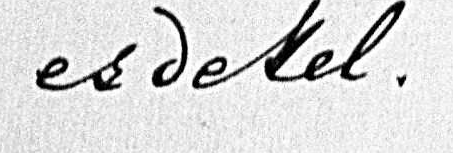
esdekel.
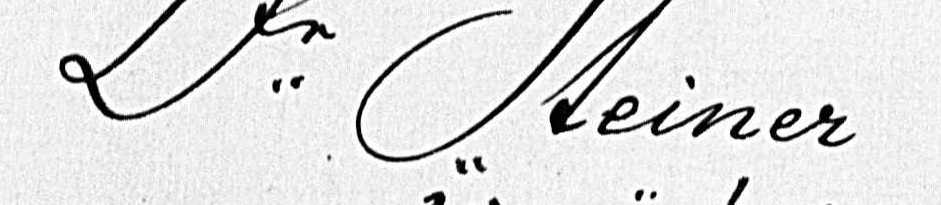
Dr. Steiner
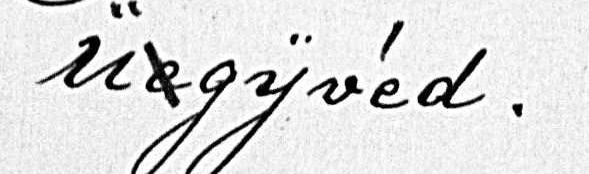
Ügÿvéd
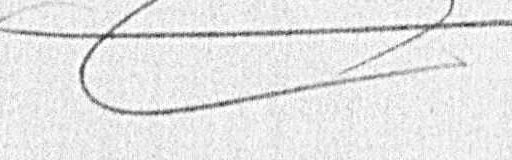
0
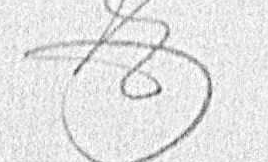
FJ
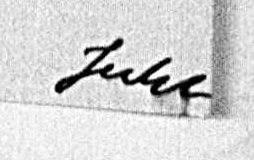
Juhl
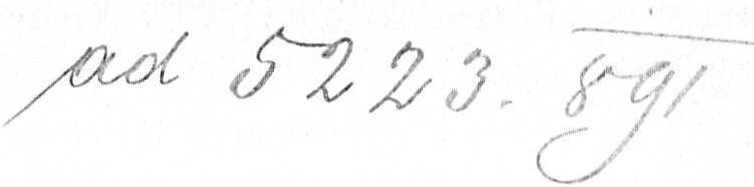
ad 5223. 891
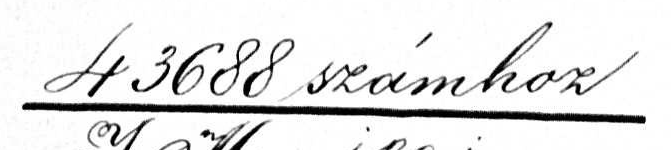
43688 számhoz
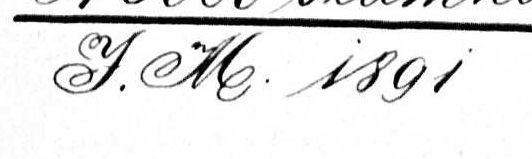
J.M. 1891
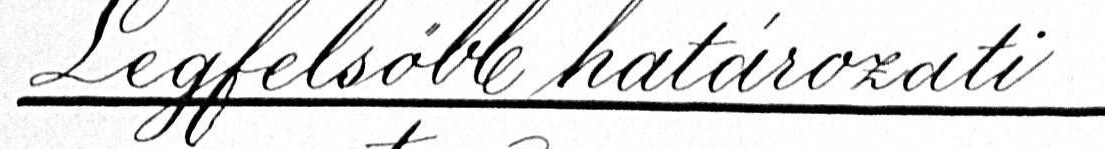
Legfelsóble határozati
